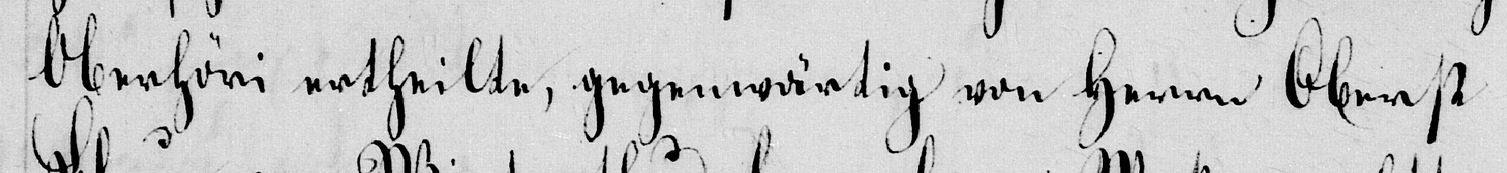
Oberhöri ertheilte, gegenwärtig von Herrn Oberst
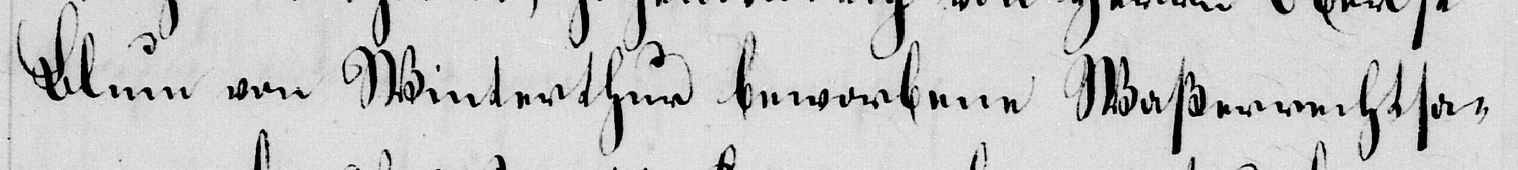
Blum von Winterthur beworbene Waßerrechtsa¬
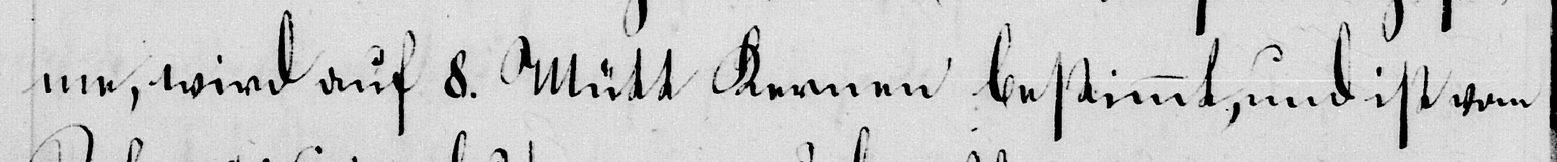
me, wird auf 8. Mütt Kernen bestimmt, und ist vom
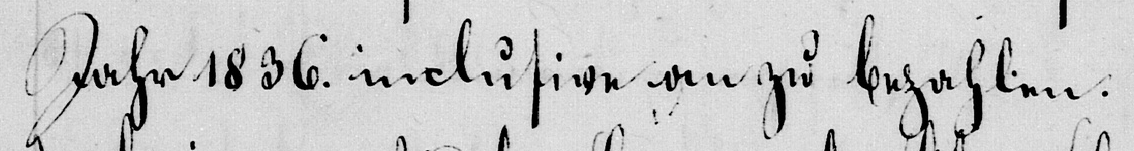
Jahr 1836. inclusive an zu bezahlen.
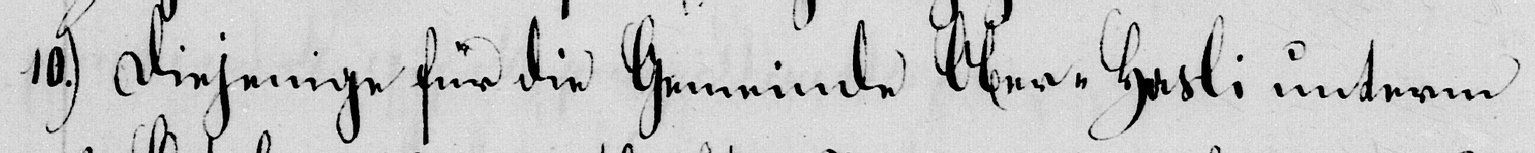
10.) Diejenige für die Gemeinde Ober-Hasli unterm
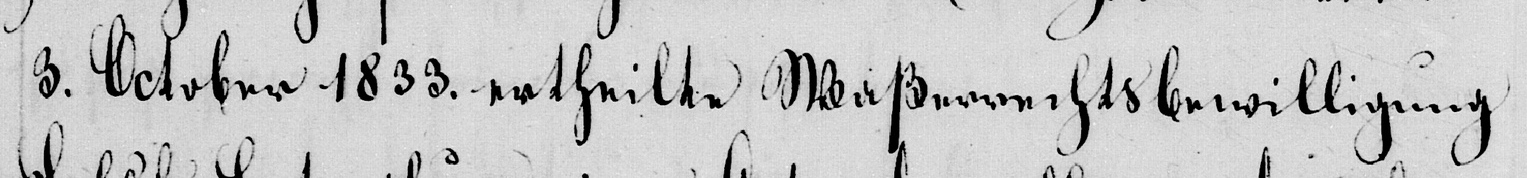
3. October 1833. ertheilte Waßerrechtsbewilligung
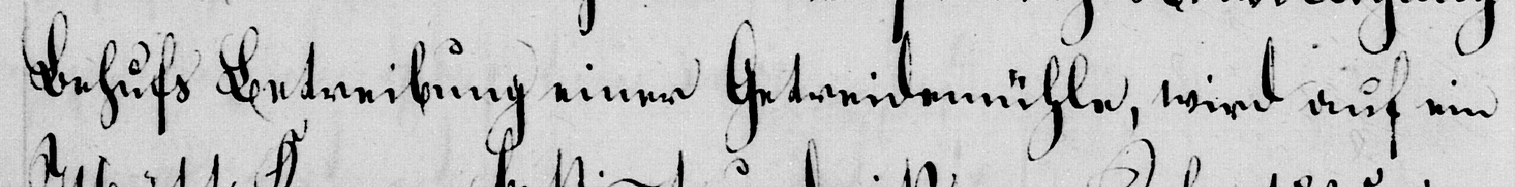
Behufs Betreibung einer Getreidemühle, wird auf ein
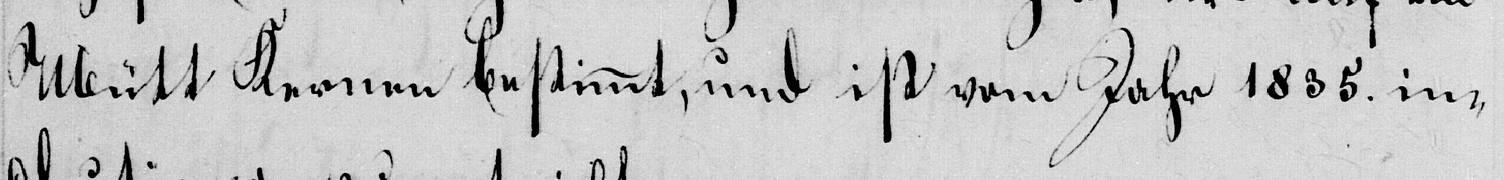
Mütt Kernen bestimmt, und ist vom Jahr 1835. in¬
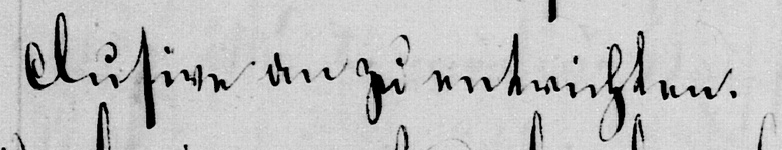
clusive an zu entrichten.
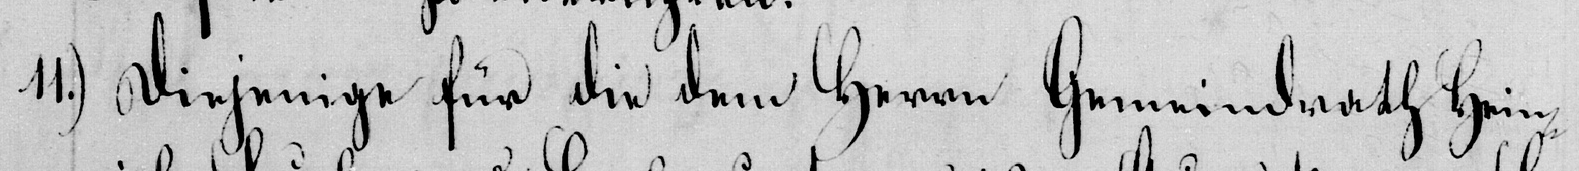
11.) Diejenige für die dem Herrn Gemeindrath Hein¬
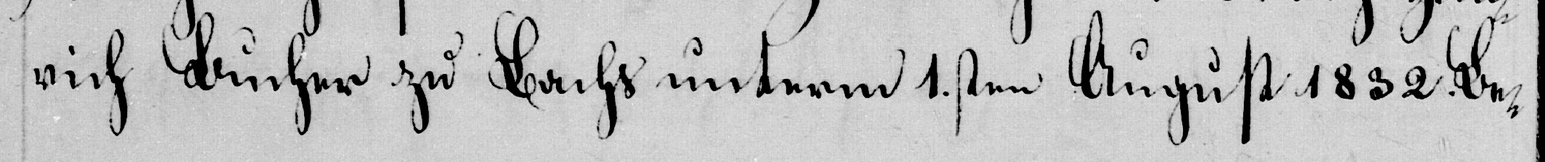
rich Bucher zu Bachs unterm 1.sten August 1832. Be-
